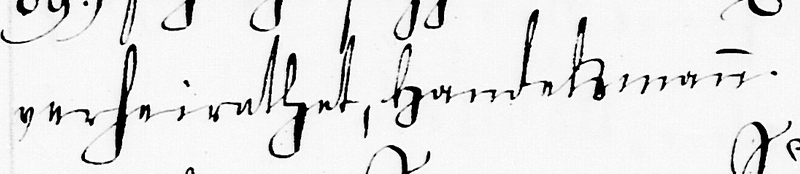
verheirathet, Handelsmann.
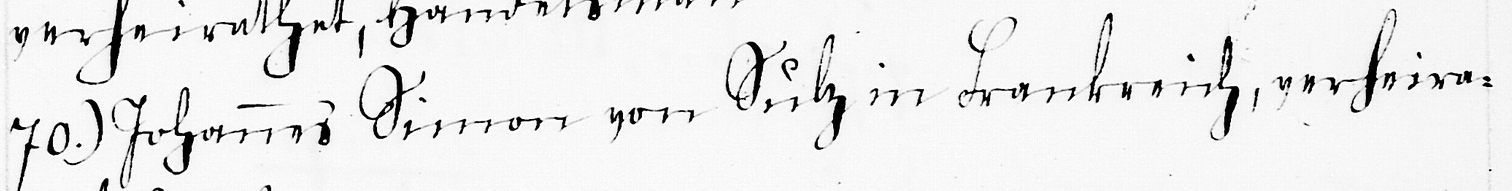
70.) Johannes Simon von Sulz in Frankreich, verheira¬
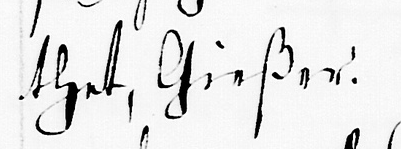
thet, Gießer.
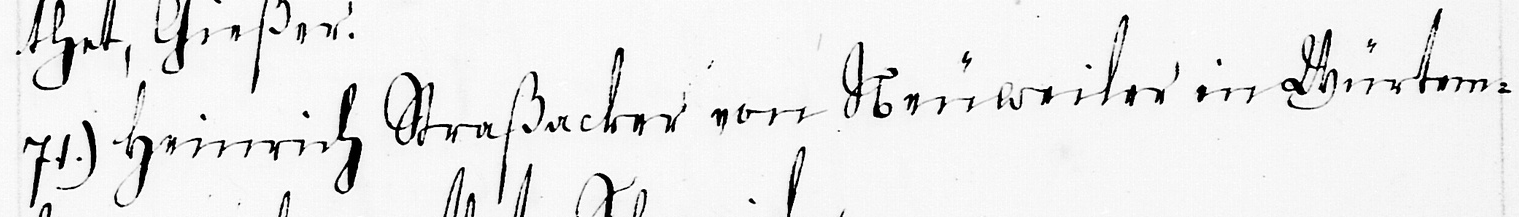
71.) Heinrich Straßacker von Neuweiler in Würtem¬
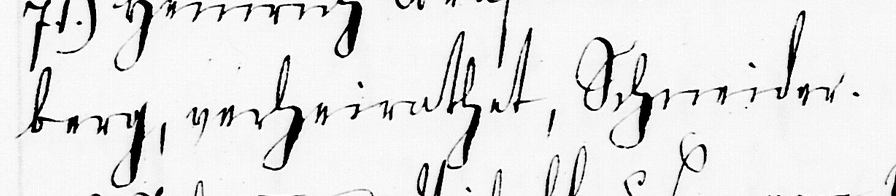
berg, verheirathet, Schneider.
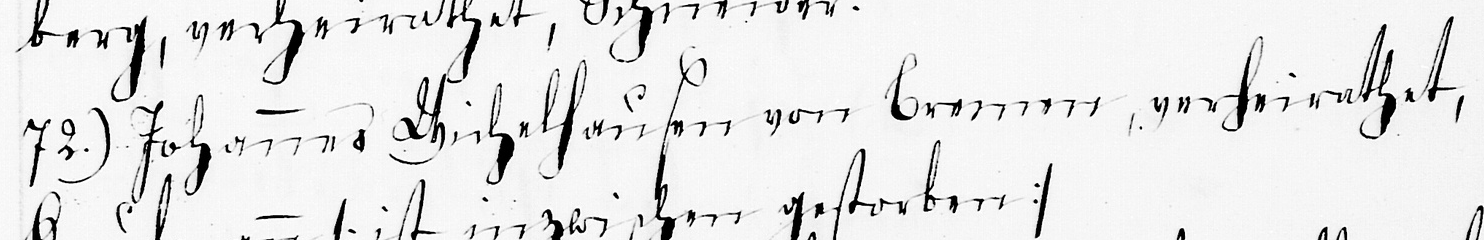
72.) Johannes Wichelhausen von Bremen, verheirathet,
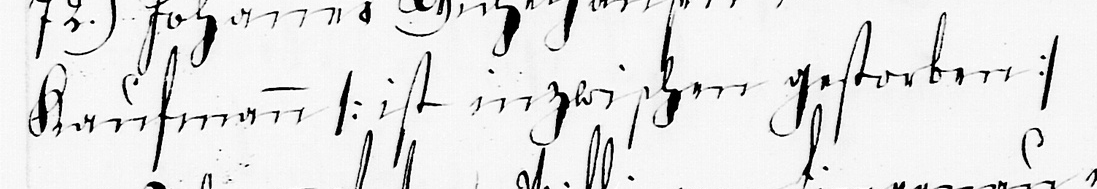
Kaufmann [ist inzwischen gestorben]
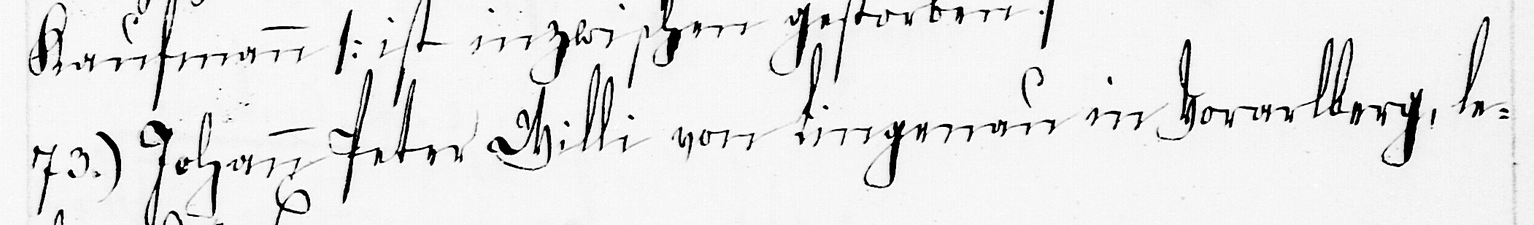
73.) Johann Peter Willi von Lingenau in Vorarlberg, le¬
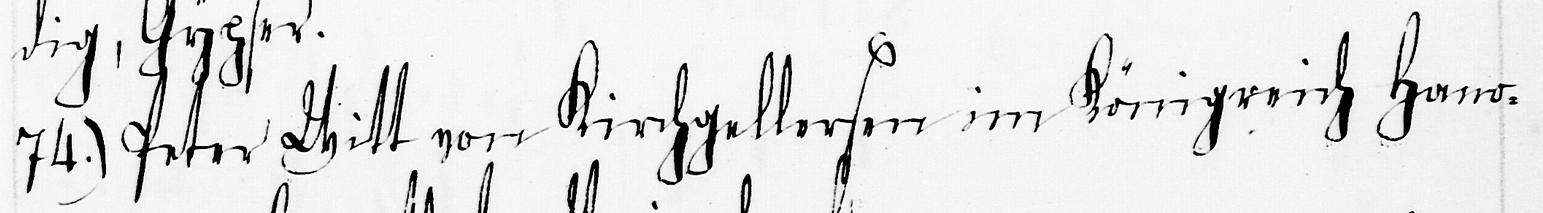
74.) Peter Witt von Kirchgellersen im Königreich Hano¬
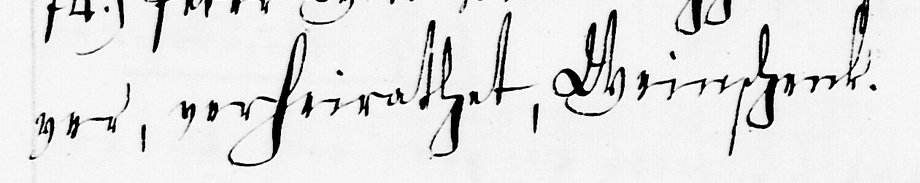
ver, verheirathet, Weinschenk.
